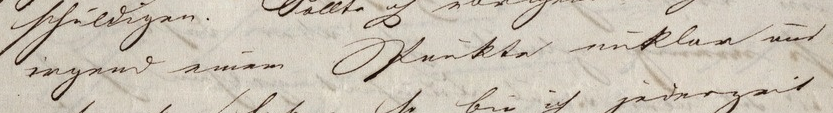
irgend einem Punkte unklar aus-
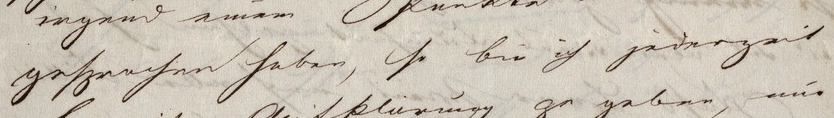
gesprochen haben, so bin ich jederzeit
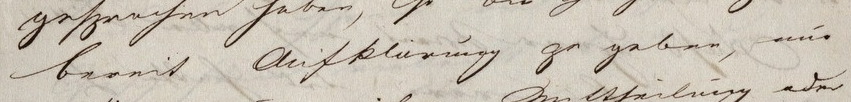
bereit, Aufklärung zu geben, nur
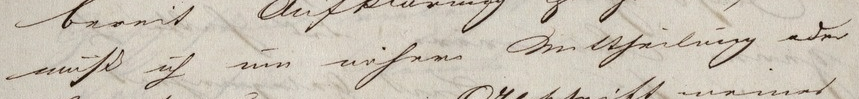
muß ich um nähere Mittheilung oder
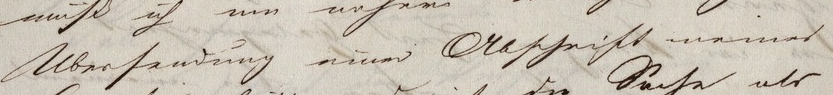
Übersendung einer Abschrift meines
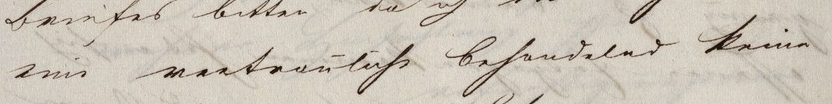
rein vertraulich behandelnd keine
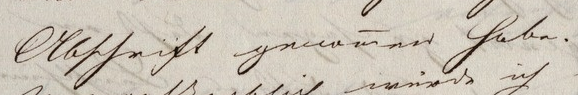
Abschrift genommen habe.
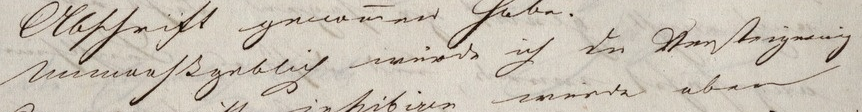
Unmaaßgeblich würde ich die Versteigerung
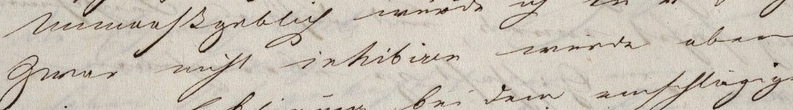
zwar nicht inhibiren würde aber
